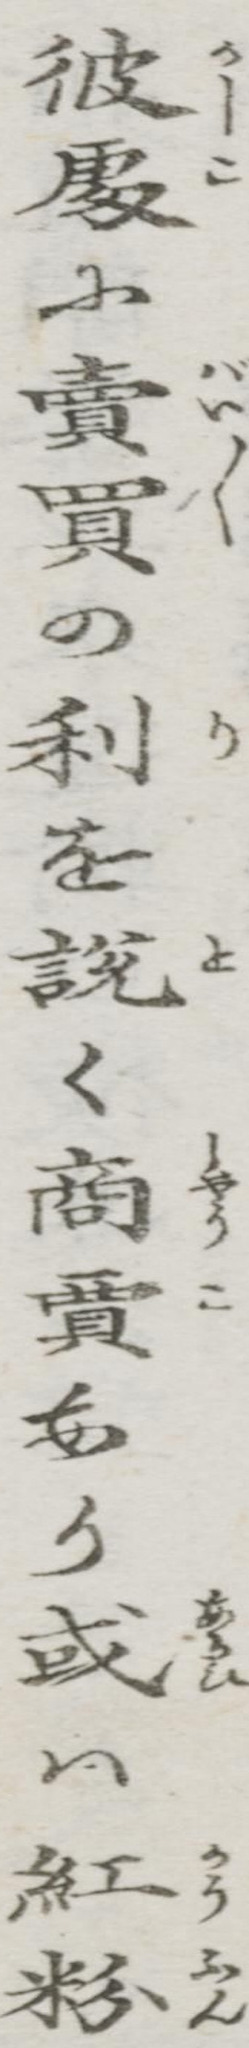彼處に賣買の利を説く商賈あり或は紅粉
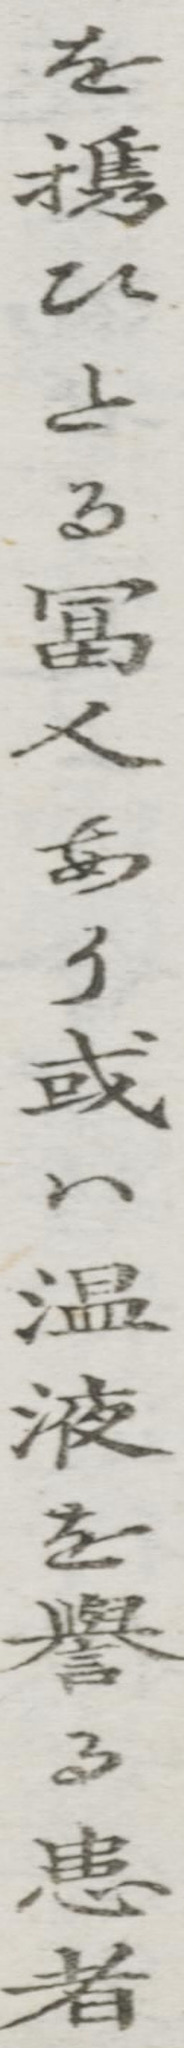を携ひたる冨人あり或は温液を譽る患者
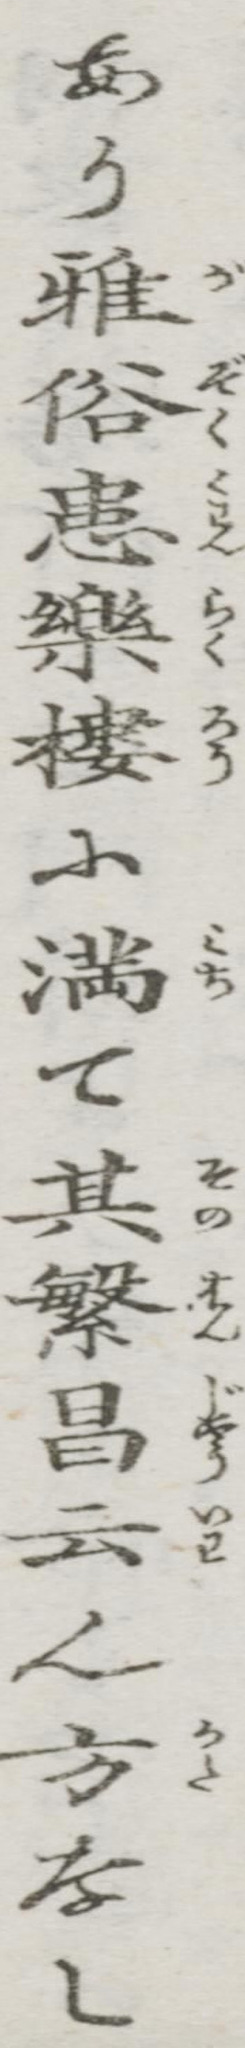あり雅俗患楽樓に満て其繁昌云ん方なし
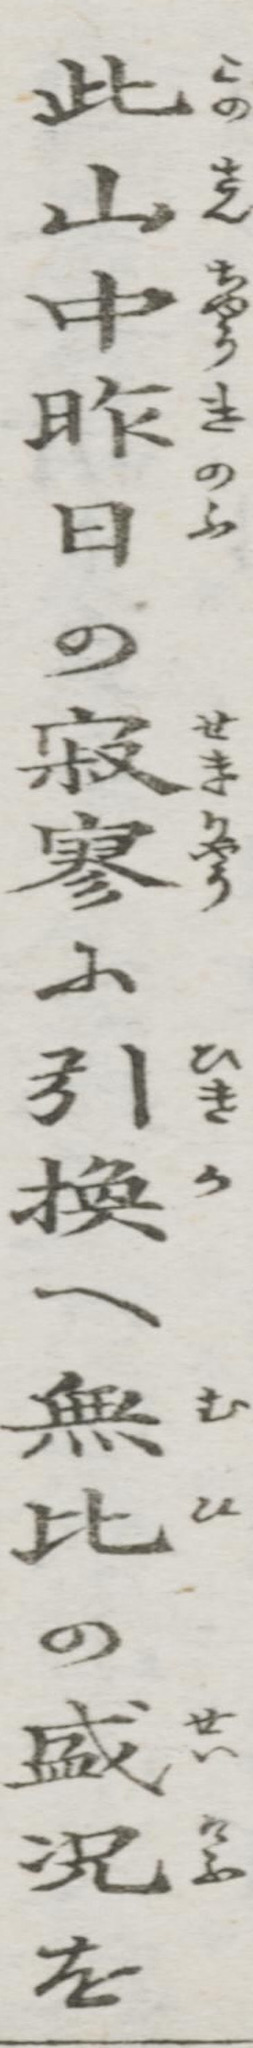此山中昨日の寂寥に引換へ無比の盛況を
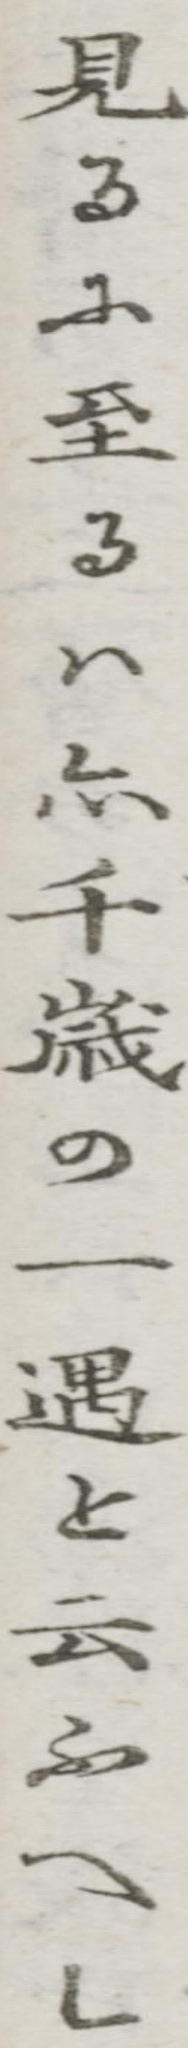見るに至るは亦千歳の一遇と云ふへし
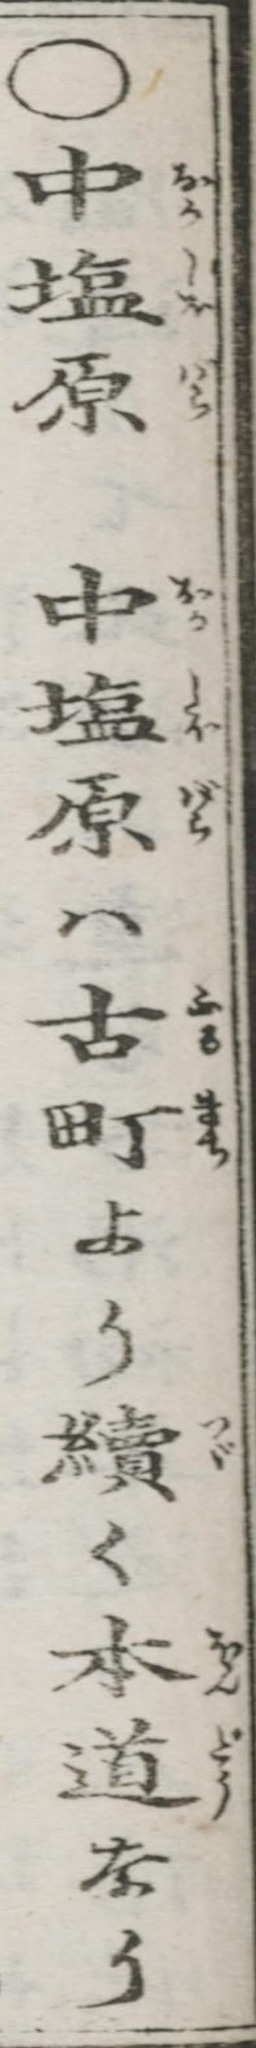○中塩原中塩原は古町より續く本道なり
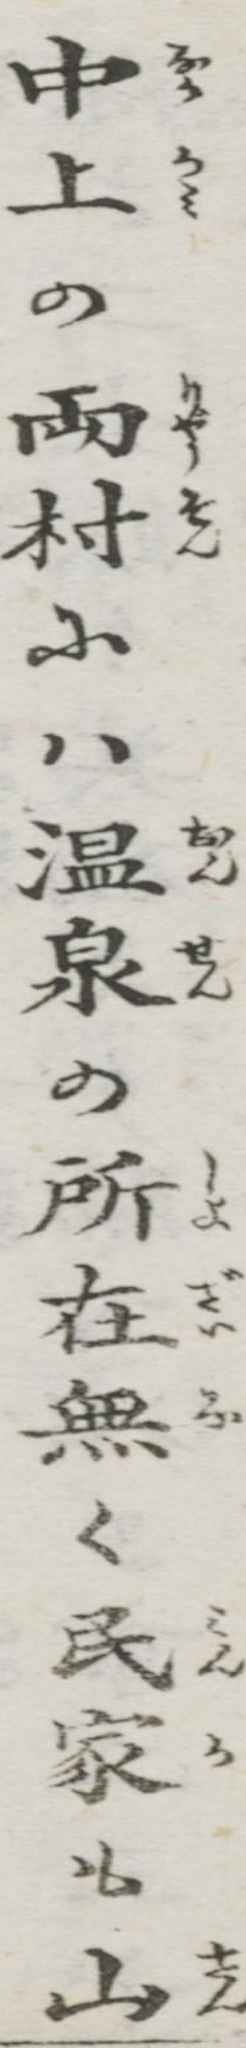中上の両村には温泉の所在無く民家も山
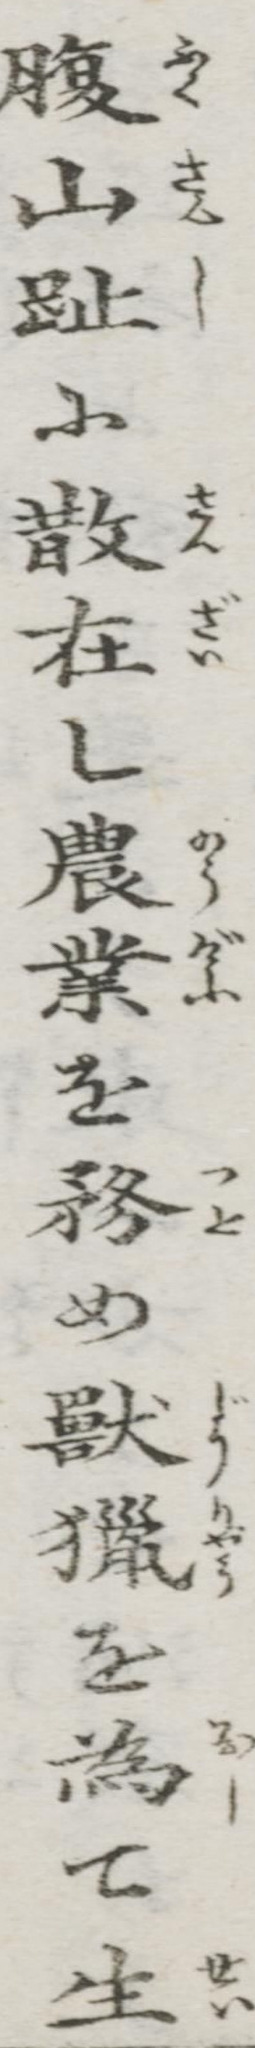腹山趾に散在し農業を務め獣猟を為て生
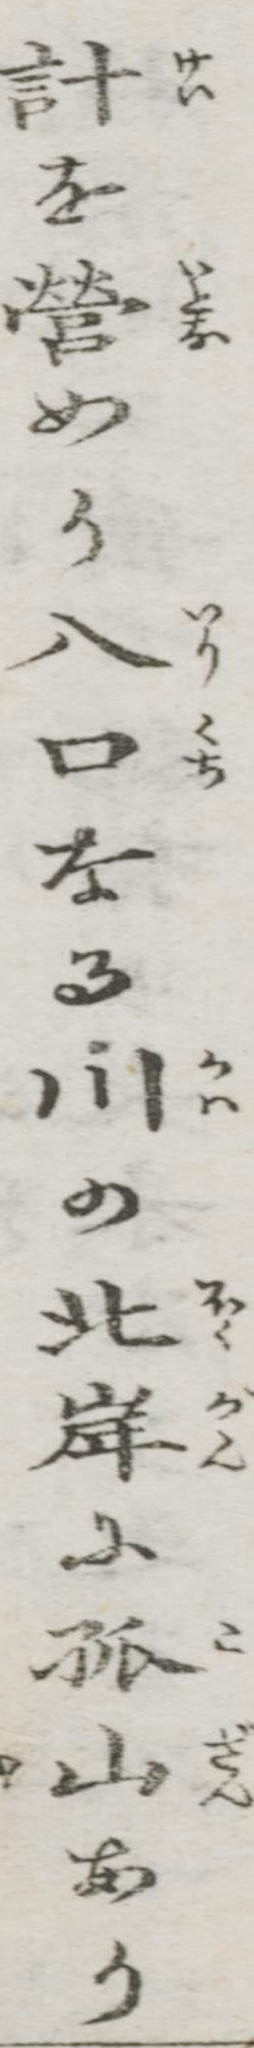計を營めり入口なる川の北岸に孤山あり
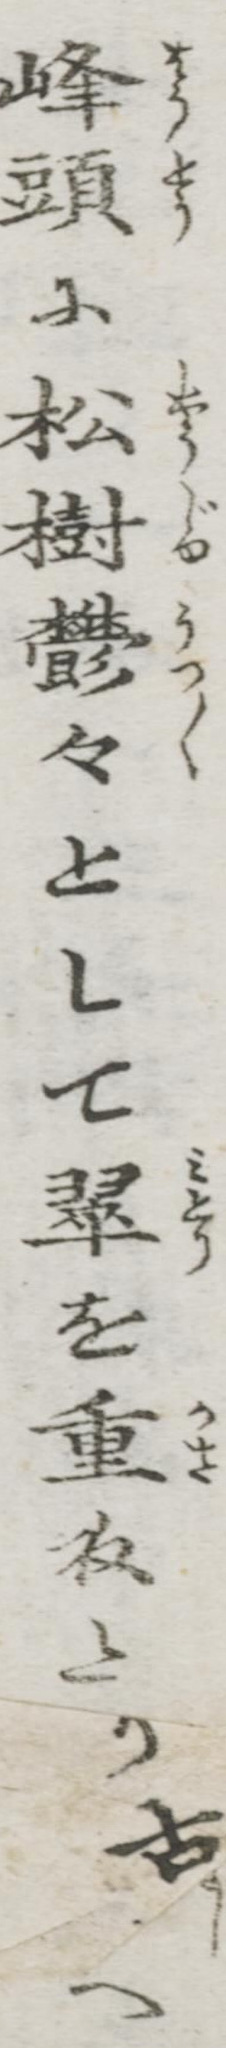峰頭に松樹鬱々として翠を重ねたり古へ
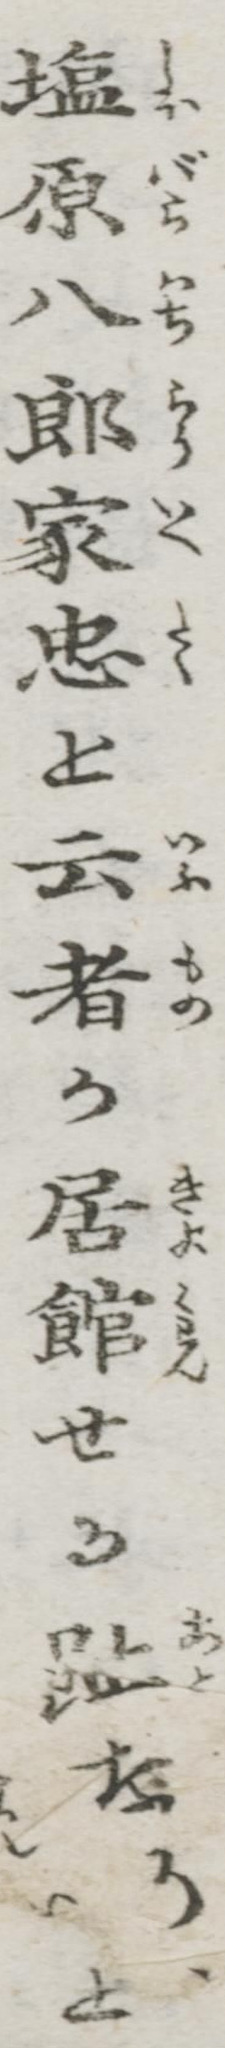塩原八郎家忠と云者か居館せる趾なりと
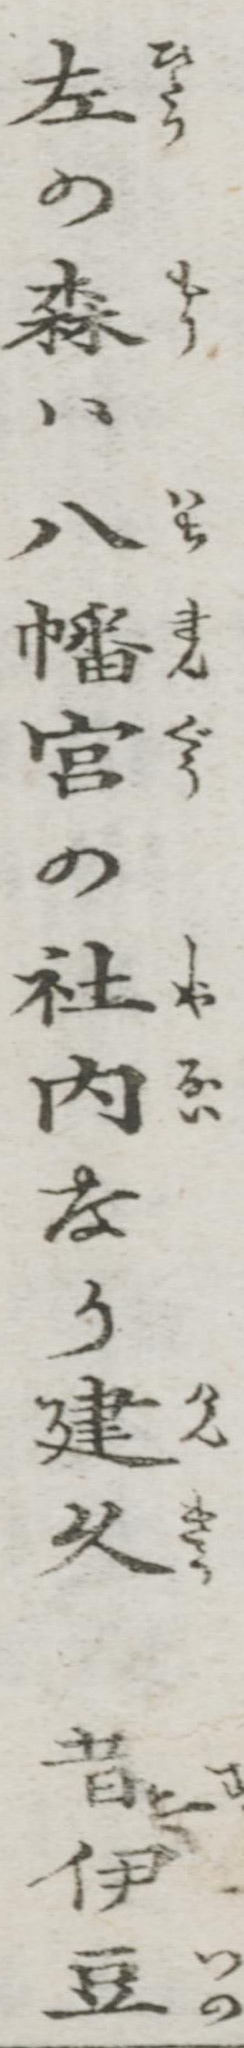左の森は八幡宮の社内なり建久昔伊豆
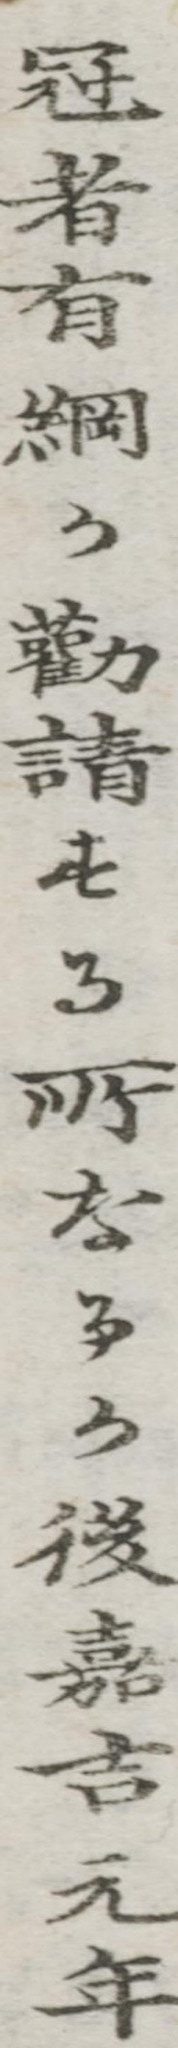冠者有綱か勧請する所なるか後嘉吉元年

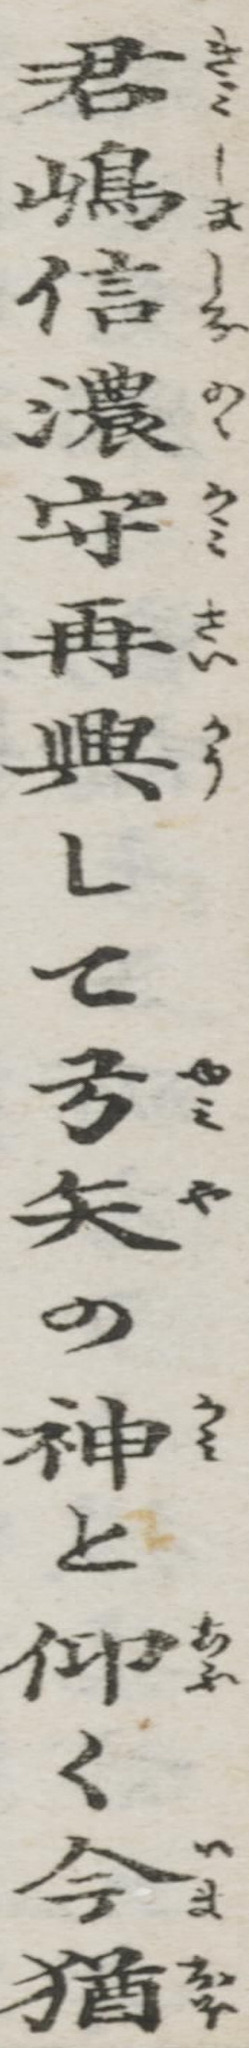君嶋信濃守再興して弓矢の神と仰く今猶
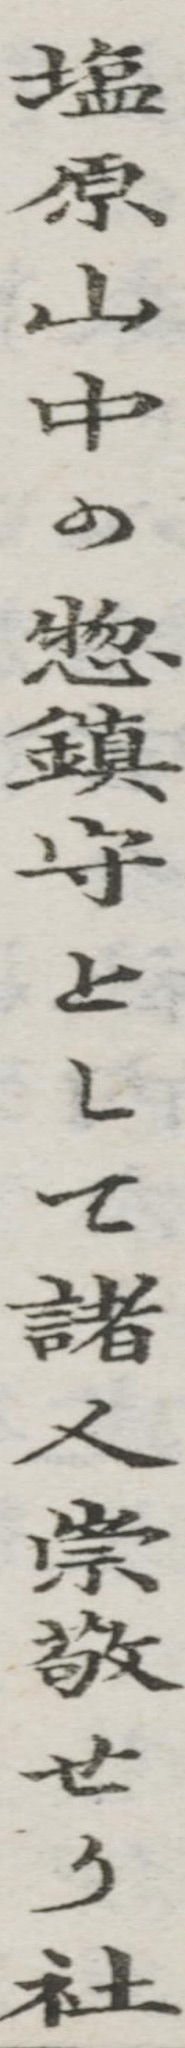塩原山中の惣鎮守として諸人崇敬せり社
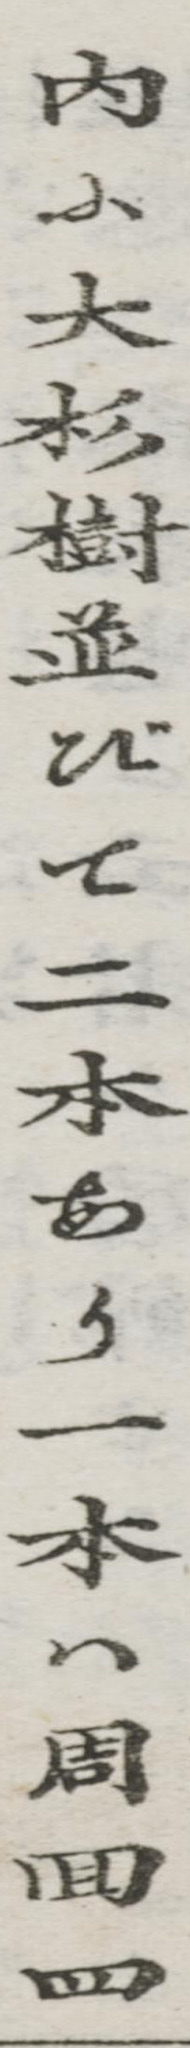内に大杉樹並びて二本あり一本は周囲四
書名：塩原繁昌記　全
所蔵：東京大学地震研究所図書室 Earthquake Research Institute Library, The University of Tokyo, JAPAN
